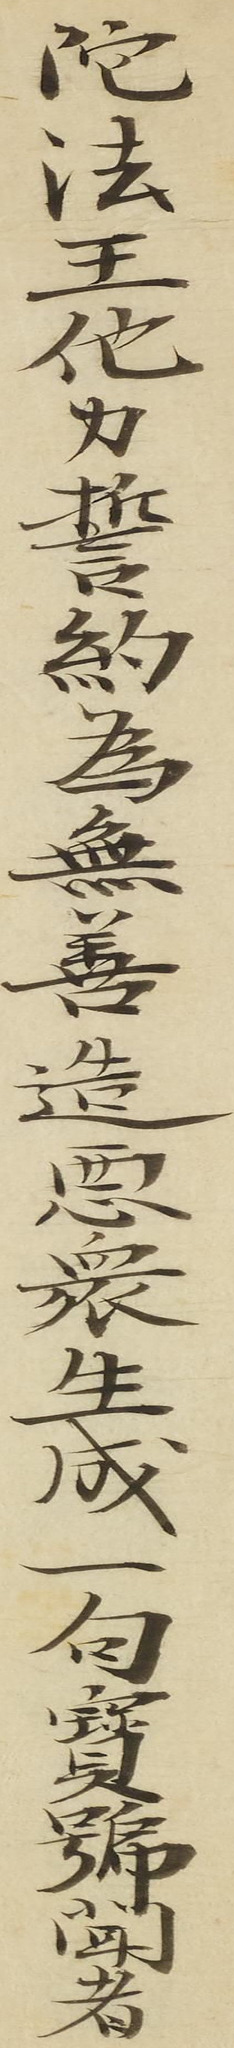陀法王他力誓約為無善造悪衆生成一句宝号聞者
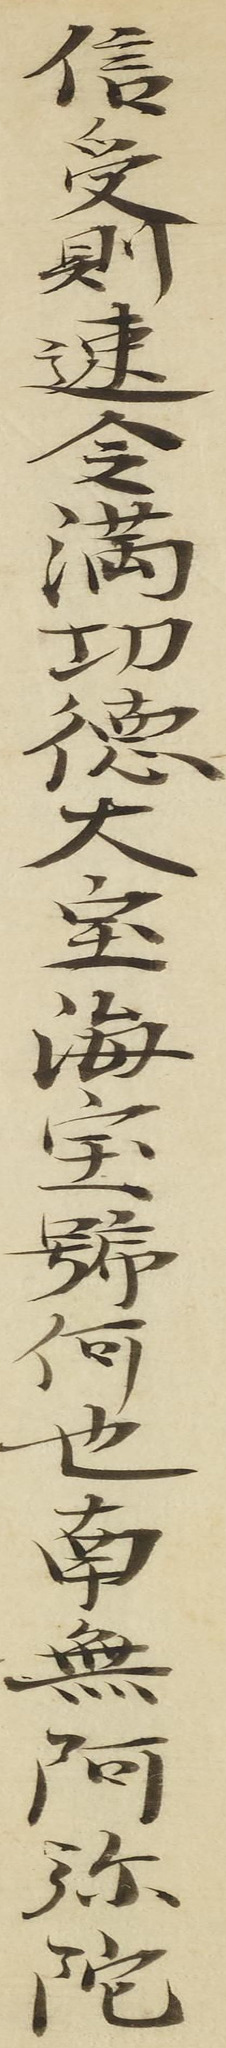信受則速令満功徳大宝海宝号何也南無阿弥陀
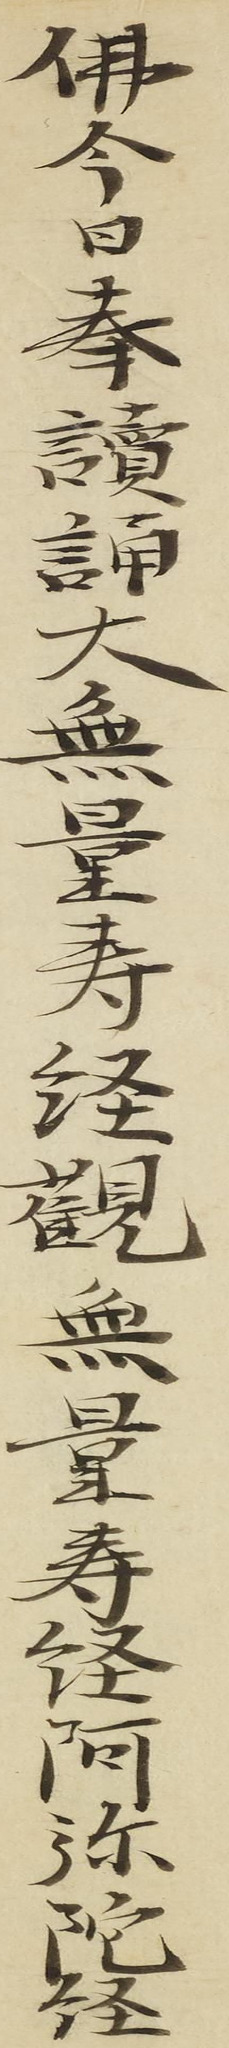仏今日奉読誦大無量寿経観無量寿経阿弥陀経
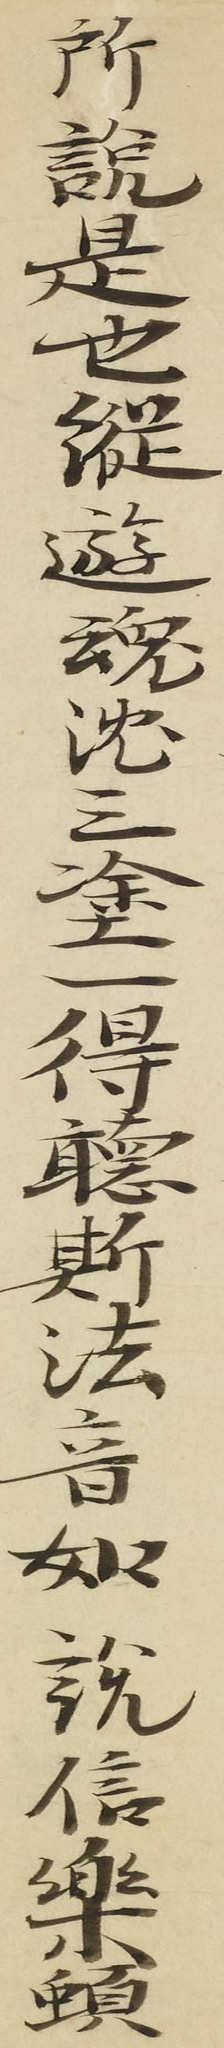所説是也縦遊魂沈三塗一得聴斯法音如説信楽頓
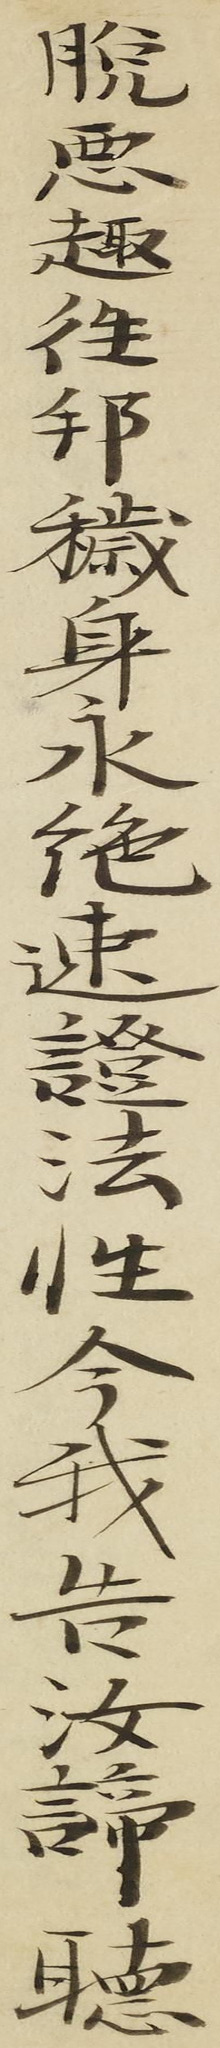脱悪趣往邦穢身永絶速証法性今我告汝諦聴
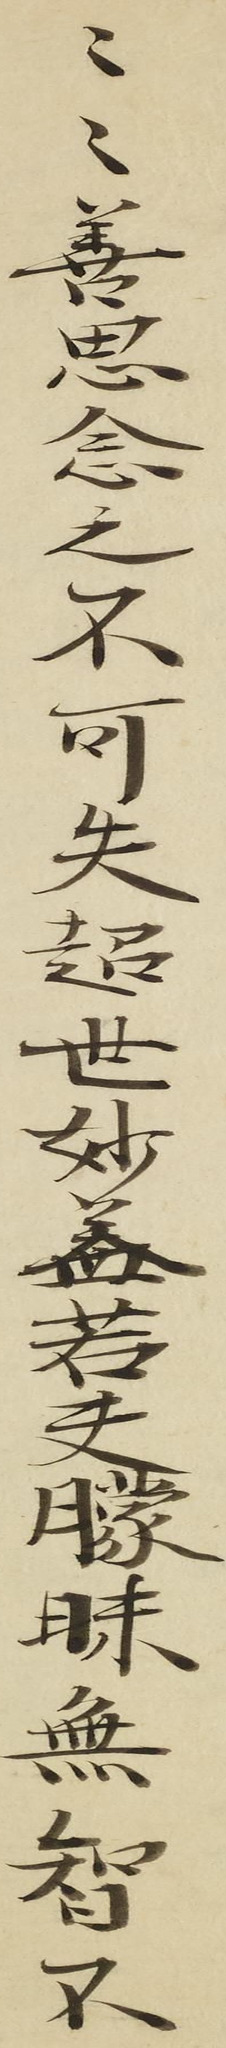々々善思念之不可失超世妙益若夫朦昧無智不
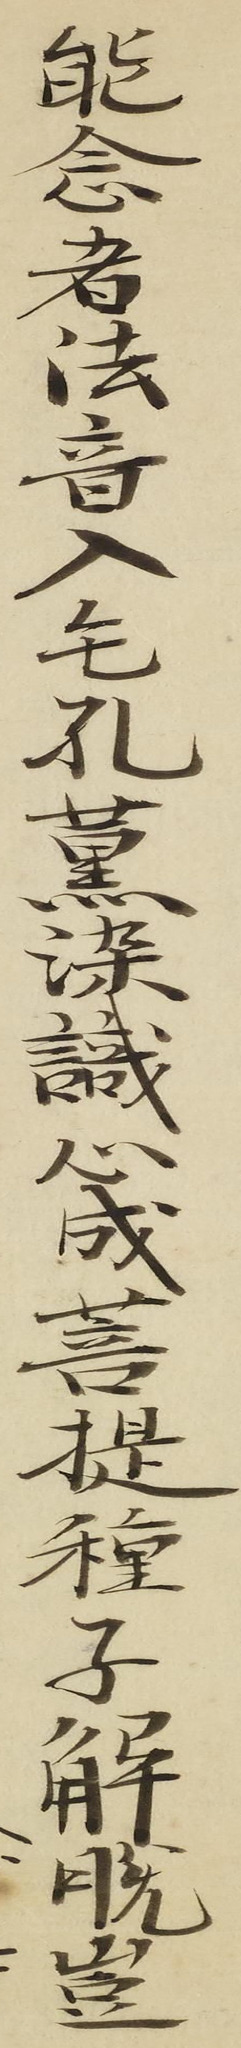能念者法音入毛孔薫染識心成菩提種子解脱豈
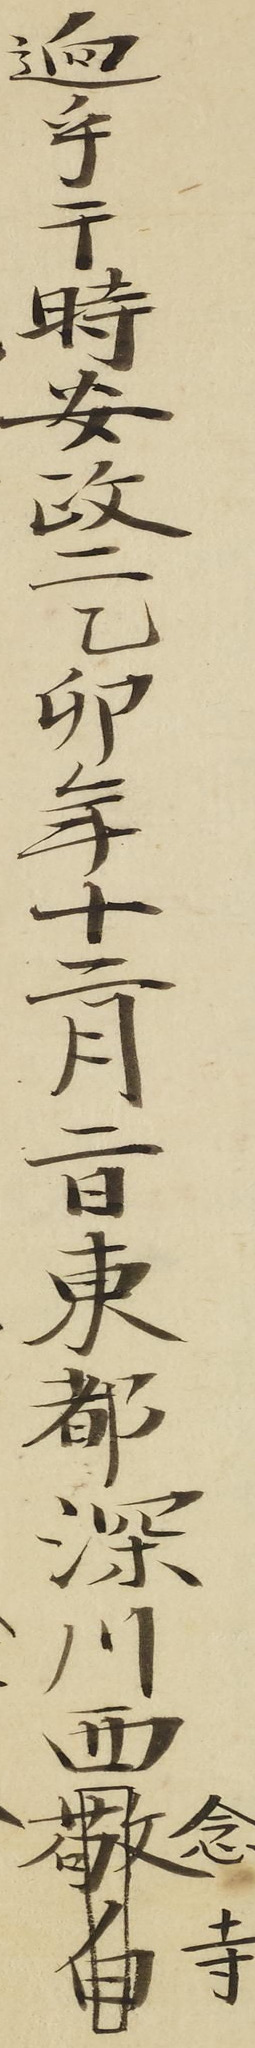逈乎于時安政ニ乙卯年十二月二日東都深川西念寺
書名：地震説　鶴高山善仁寺天柗老人著述　全
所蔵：東京大学地震研究所図書室 Earthquake Research Institute Library, The University of Tokyo, JAPAN
